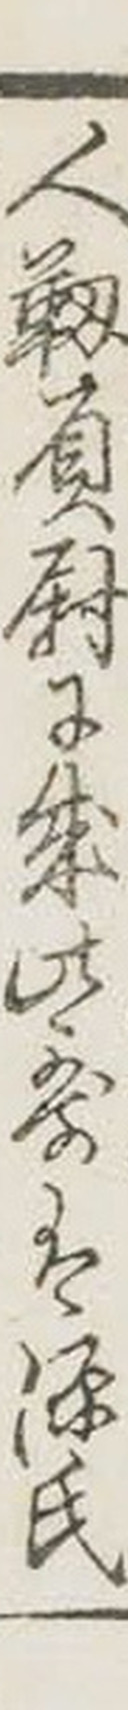人靫負尉に成此哥は源氏
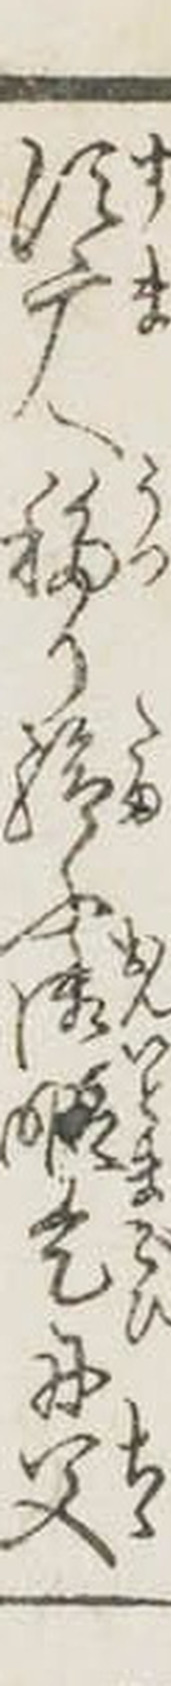須磨へ移り給ふ御暇乞に父
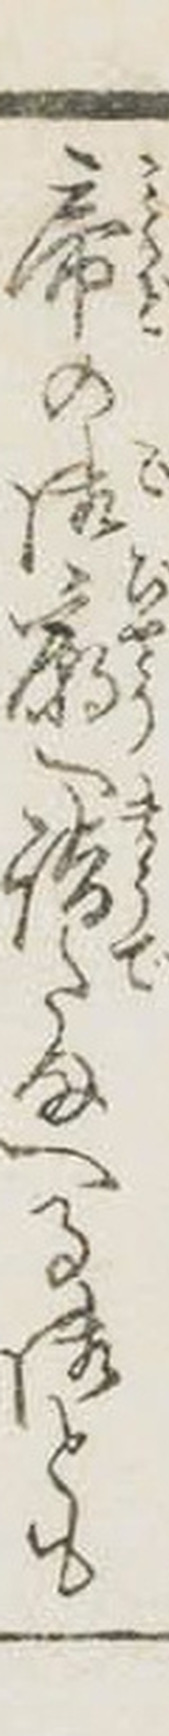帝の御廟へ詣たまへる御とも
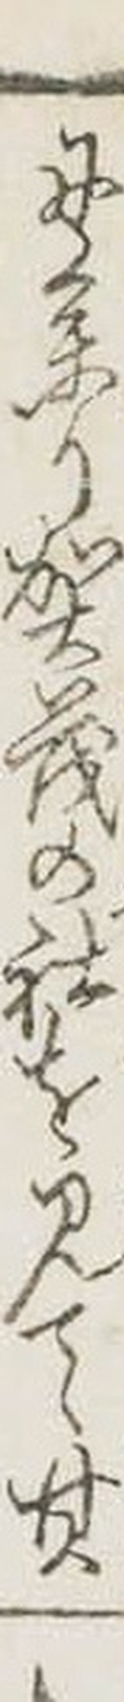に参り賀茂の社を見て其
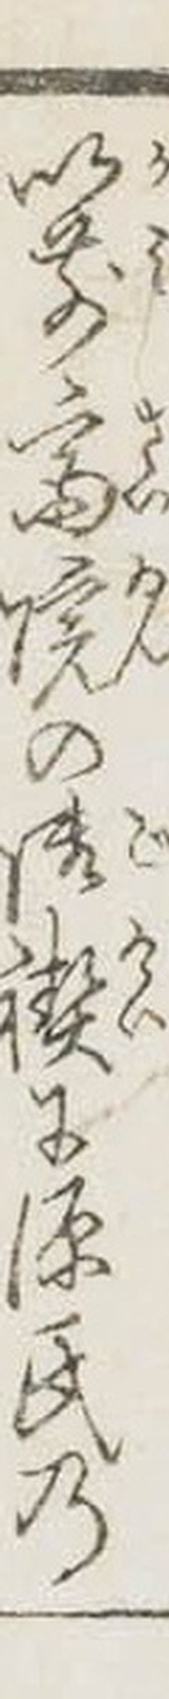以前斎院の御禊に源氏の
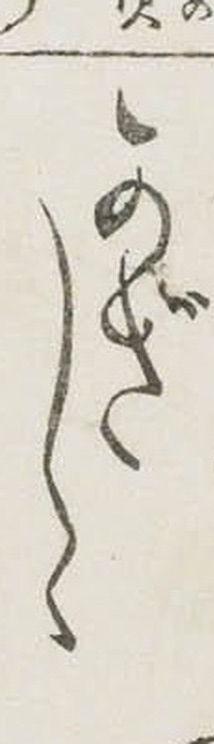かざし
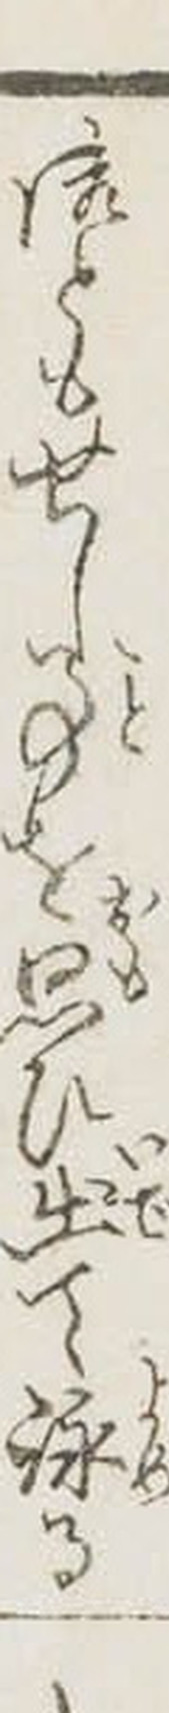御ともせし事を思ひ出て詠る
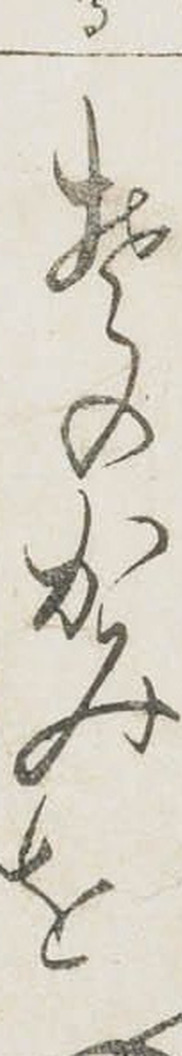そのかみを
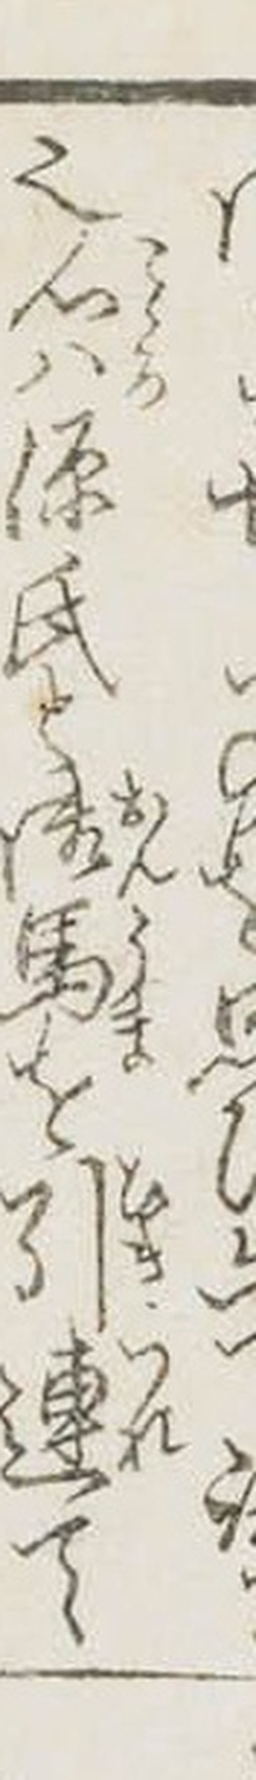也心は源氏と御馬を引連て
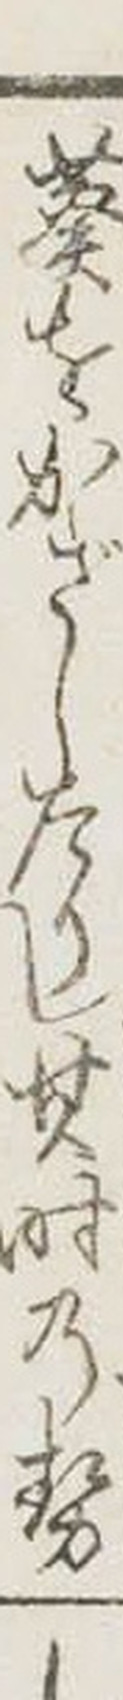葵をかざしたりし其時の勢
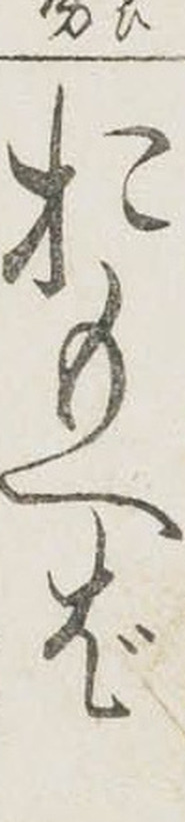おもへば
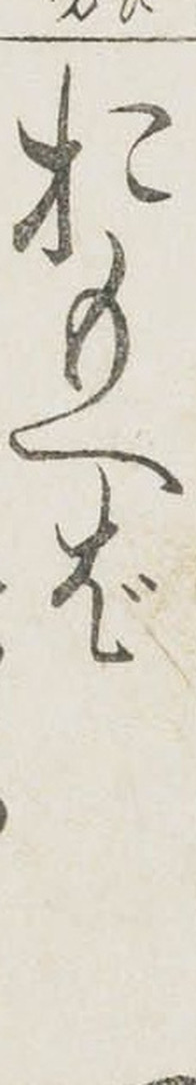おもへば
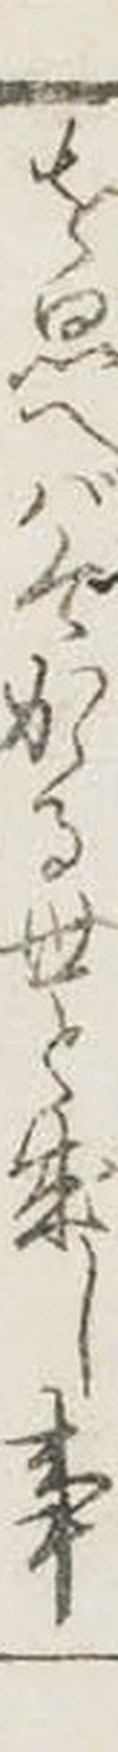を思へば今かゝる世と成し事
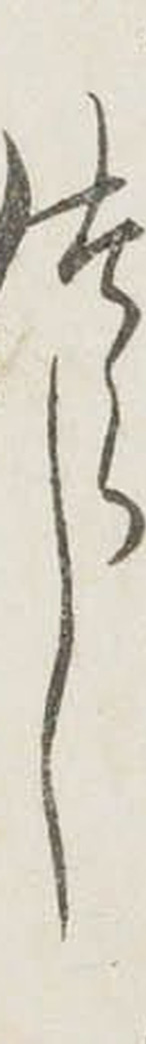つらし
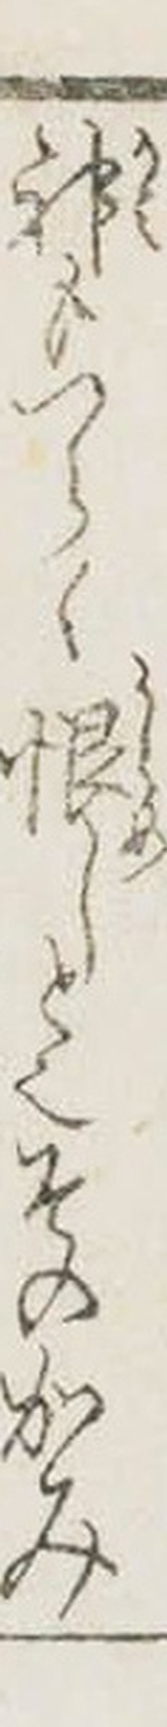神もつらく恨しと也そのかみ
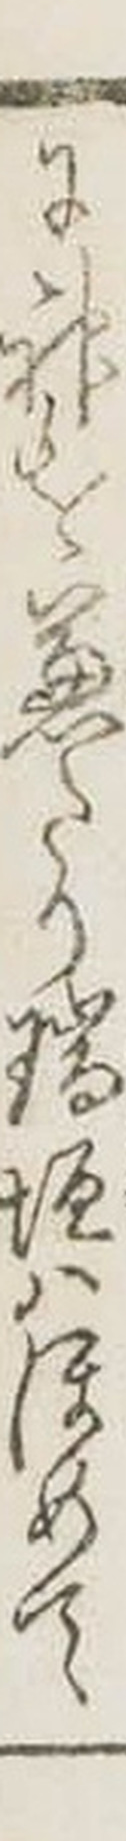に神を兼たり瑞垣はほめて
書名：源氏百人一首
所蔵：東京学芸大学教育コンテンツアーカイブ
